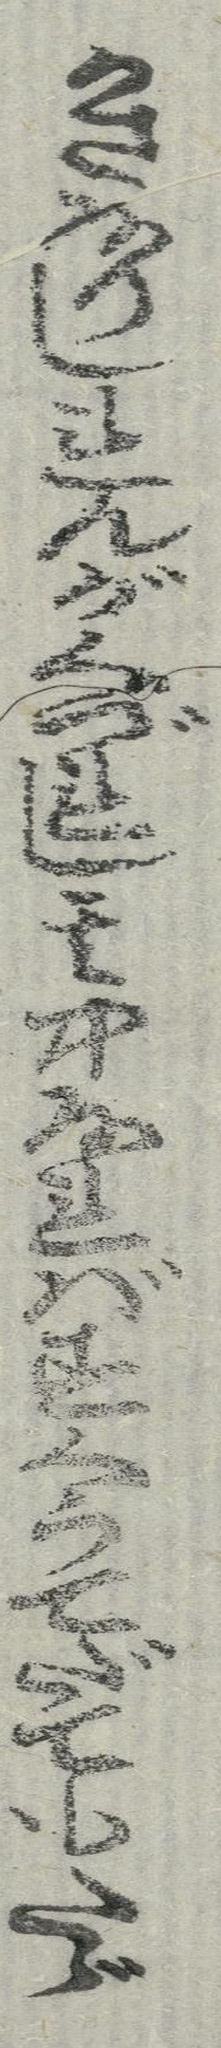かさなりしれんがくづれし其中なればすくうたるうてだてもたゞ
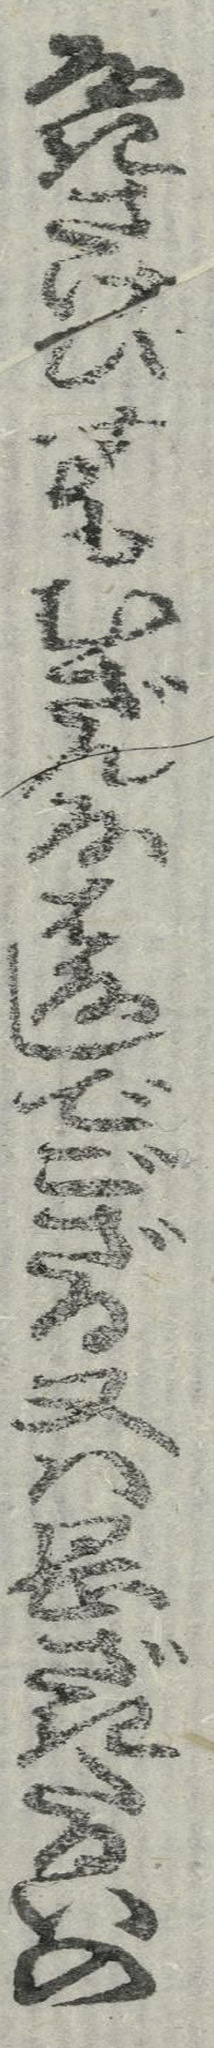なきさけひ聞もむざんなはなしでござる又は岡ざきたるいの
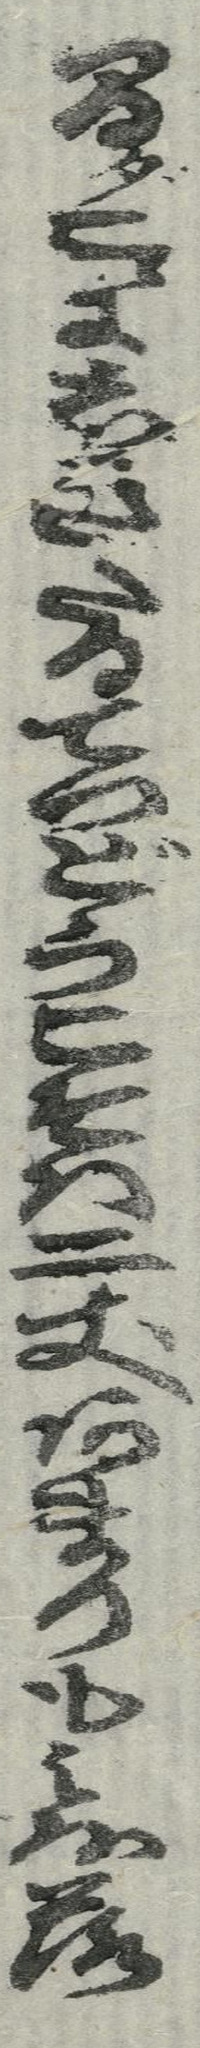間ダこゝにしきたるてつどうこそは二丈あまりもみな落

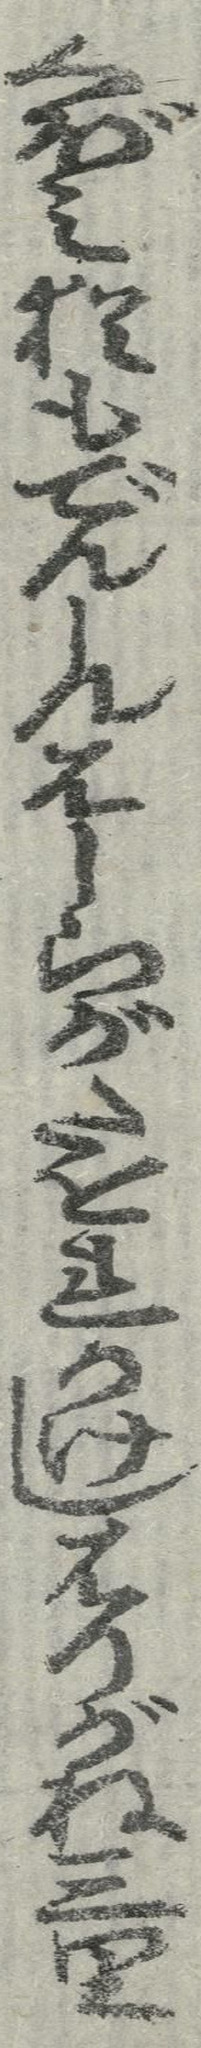くぼみ猶もでんしんはしらがたをれかけしはりがね三里
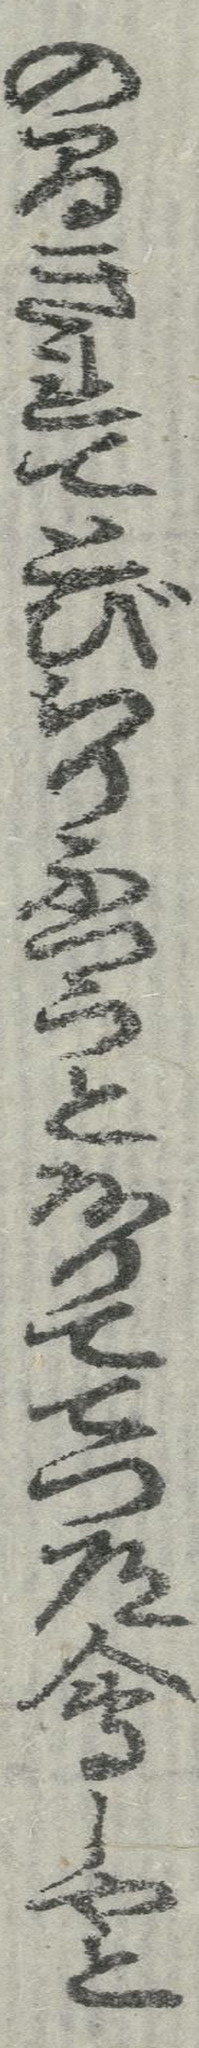の間きれてとびちりふつうとなりててつ道会しやと
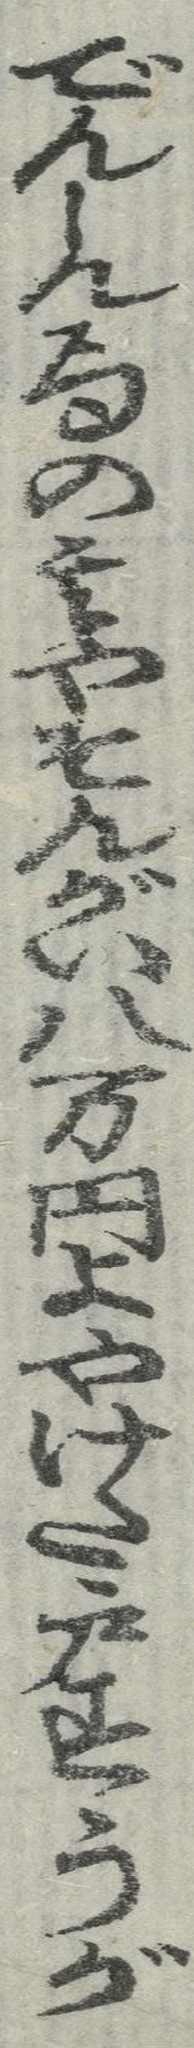でんしん局の其やそんがい八万円よやけた戸すうが
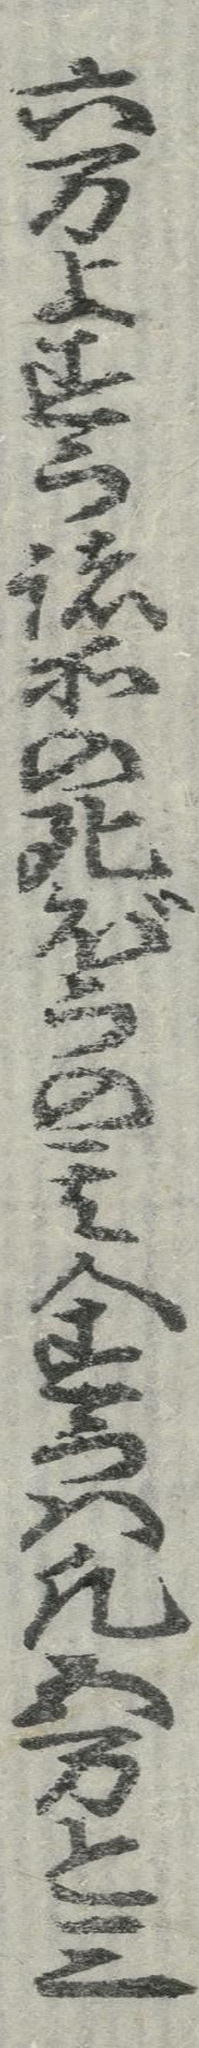六万よすう諸所の死ぼうの其人すうは凡五万と三
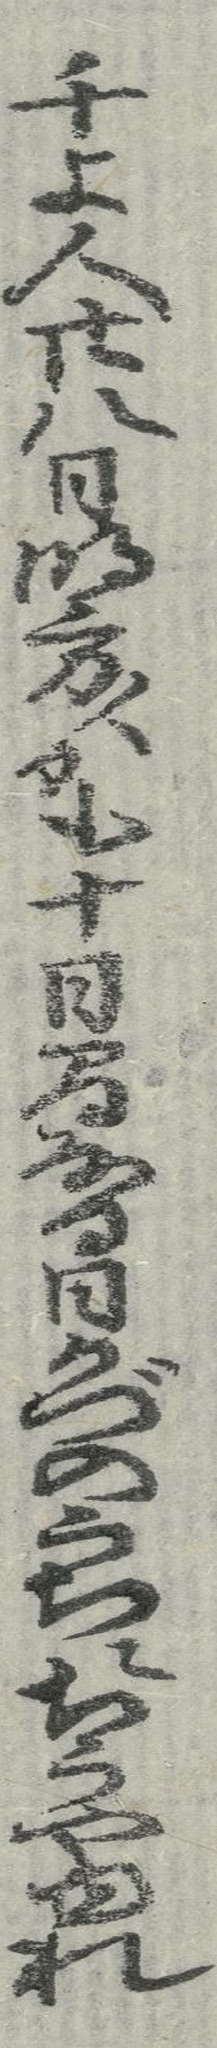千よ人廿八日明方よゟも十日間なる日かづのうちニちうやゆれ
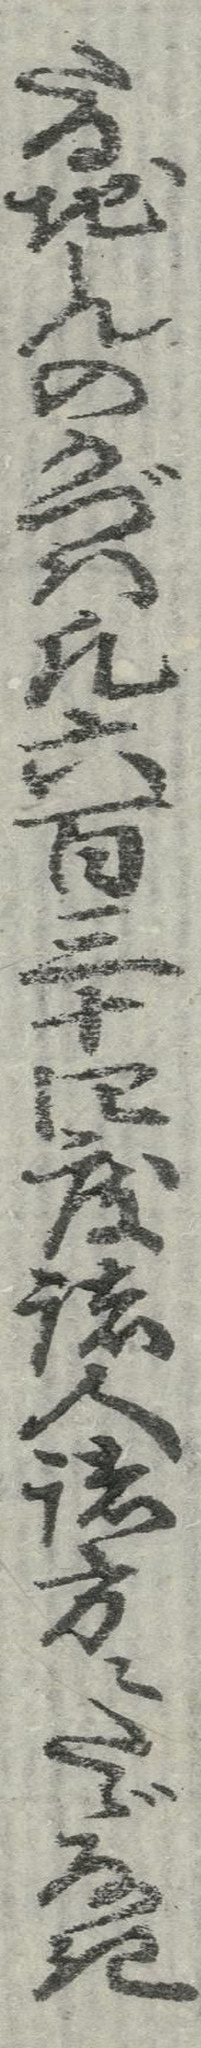たる地しんのかづは凡六百三十四度諸人諸方ニたゞなき
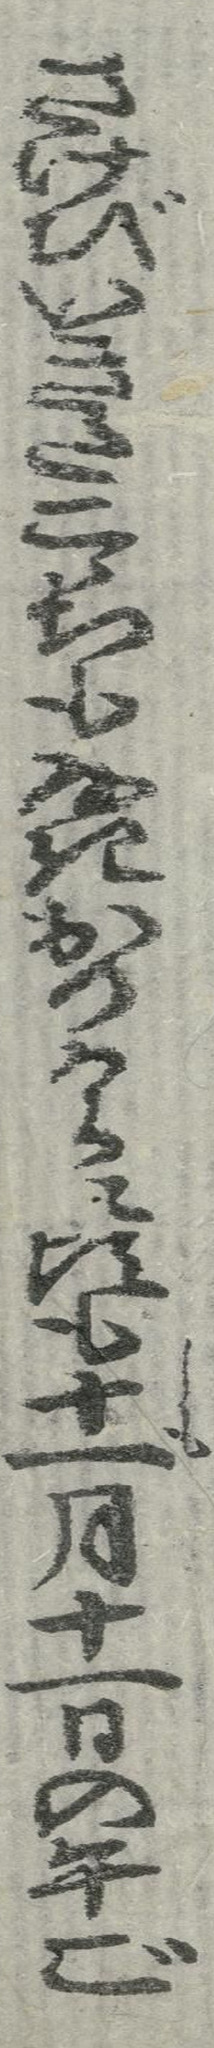さけびいきたこゝちもなきおりからに頃も十一月十一日の午ご
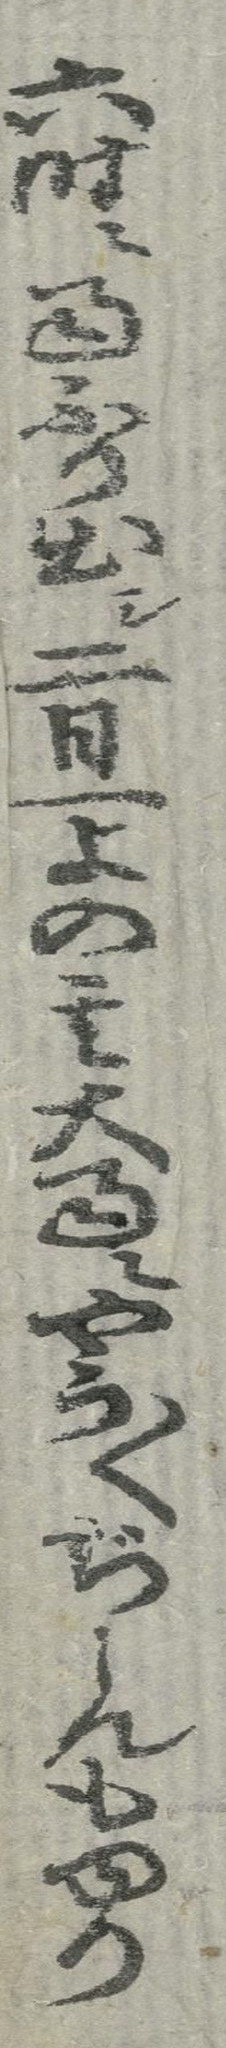六時ニ雨ふり出シ二日一よの其大雨ニやう〳〵ぢしんもゆり
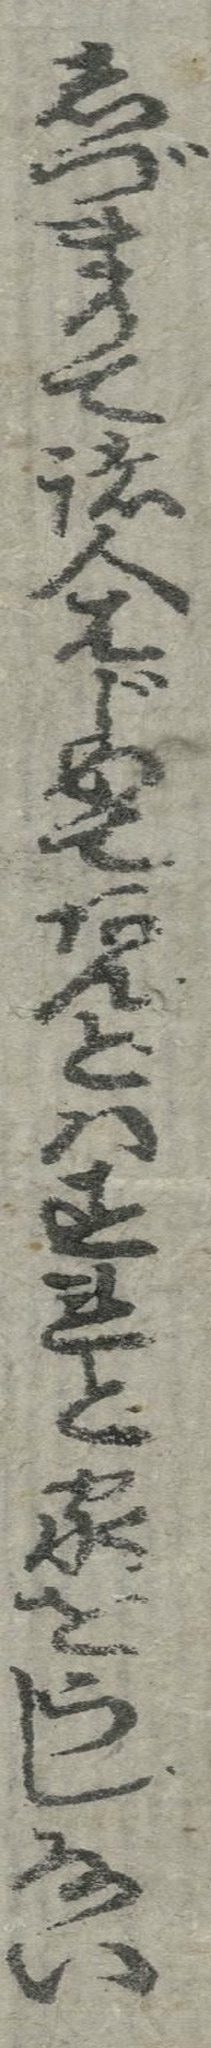しづまりて諸人はじめてあんどはすれと家をうしない
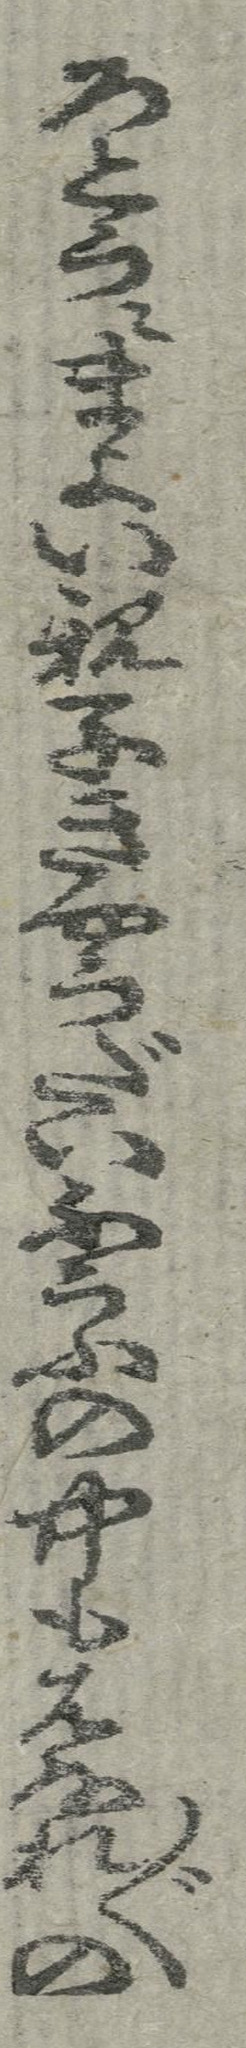ろとうニまよい親子きやうだいふうふの中もはなれ〴〵の
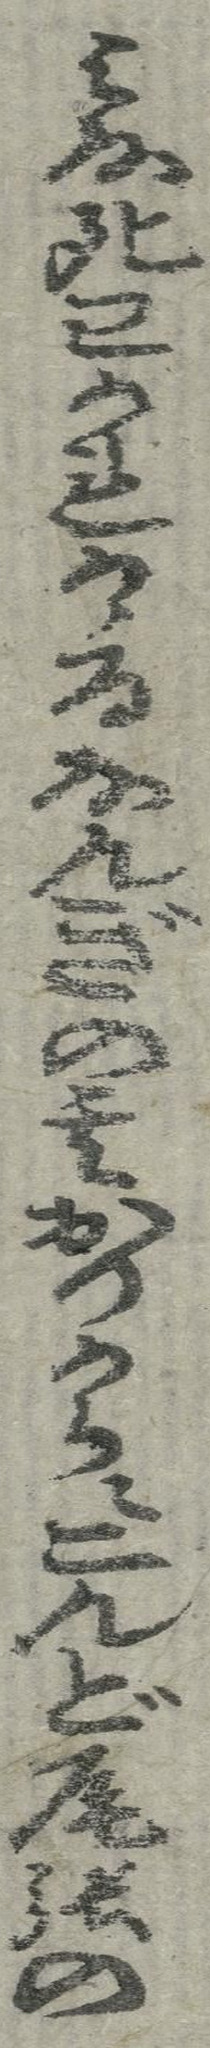みな死わかれかゝるなんぎの其おりからニこんど尾張の
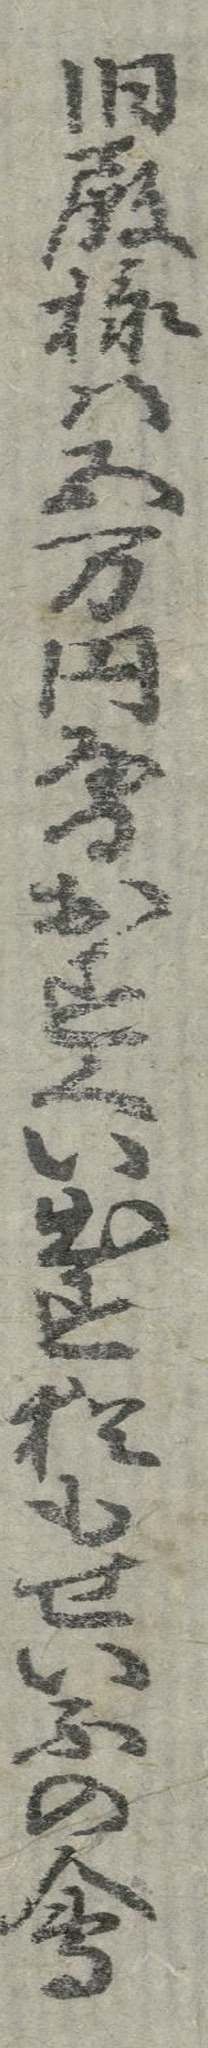旧殿様は五万円なるおすくい出す猶もせいふの会
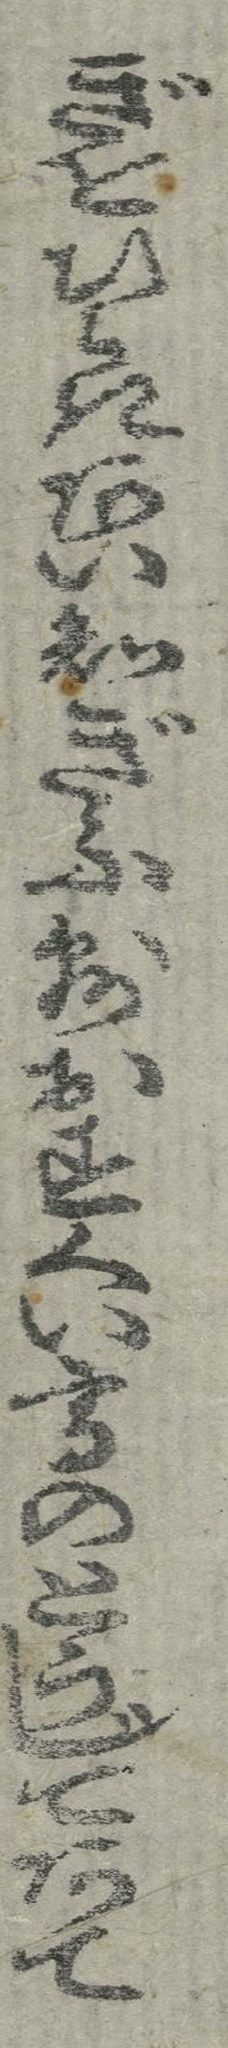ぎをひらきあい知ぎふ県おすくい高のとうじてあて
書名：十二ヶ国大地しんくどき
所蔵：東京大学地震研究所図書室 Earthquake Research Institute Library, The University of Tokyo, JAPAN
